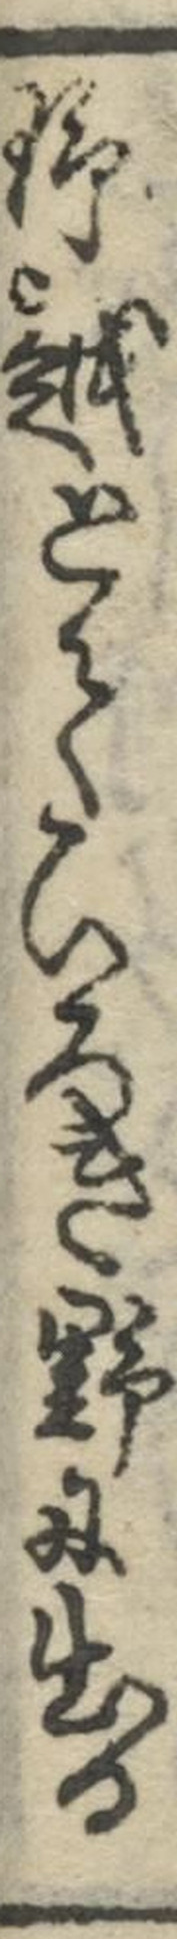沢越とてひろき野に出る
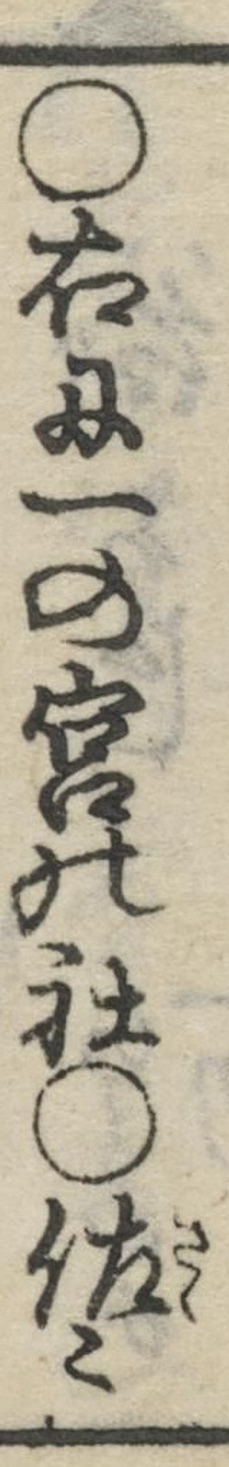○右に一の宮の社○佐〻
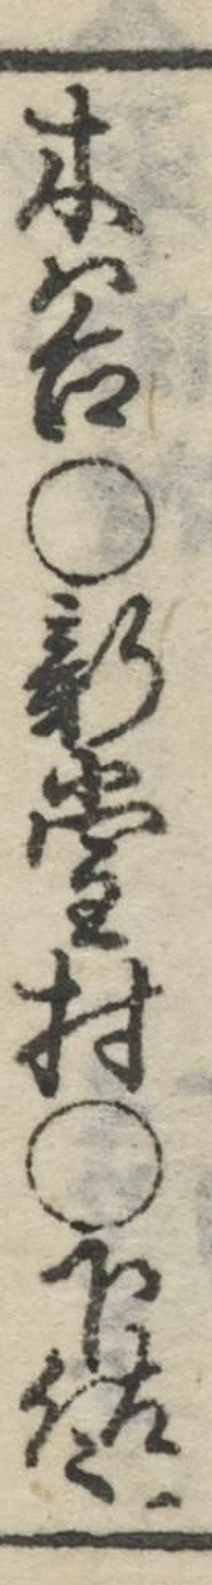木谷○新堂村○下佐々
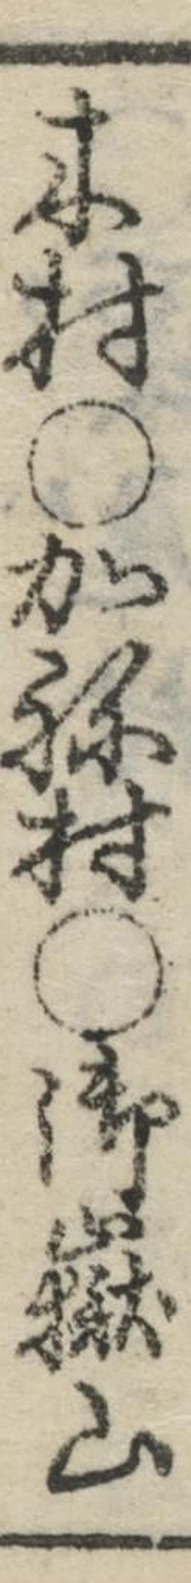木村○加祢村○御嶽山
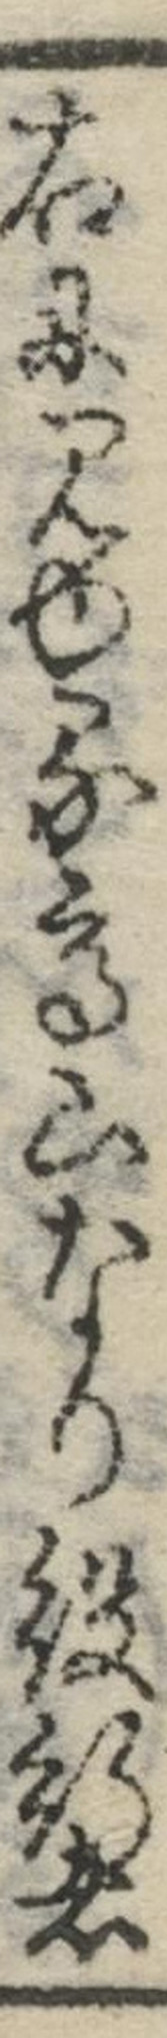右に見ゆる高山なり役行者
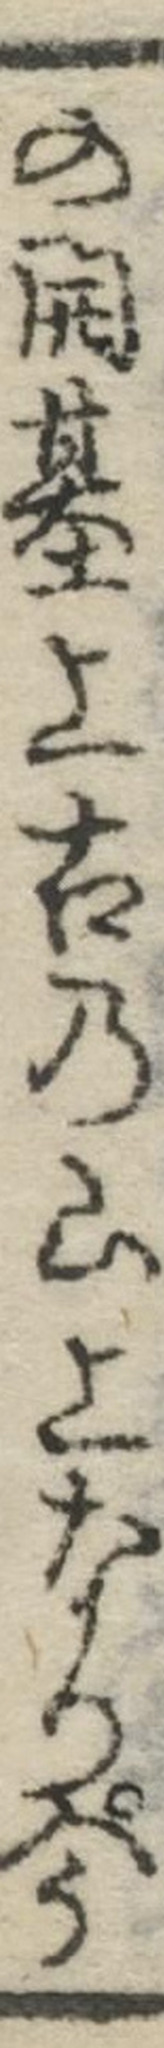の開基上古の山上なり。今
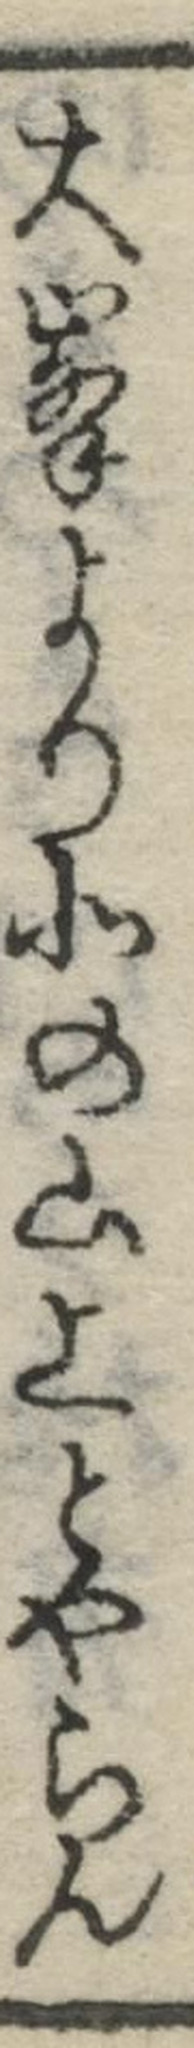大峯より北の山上とやらん
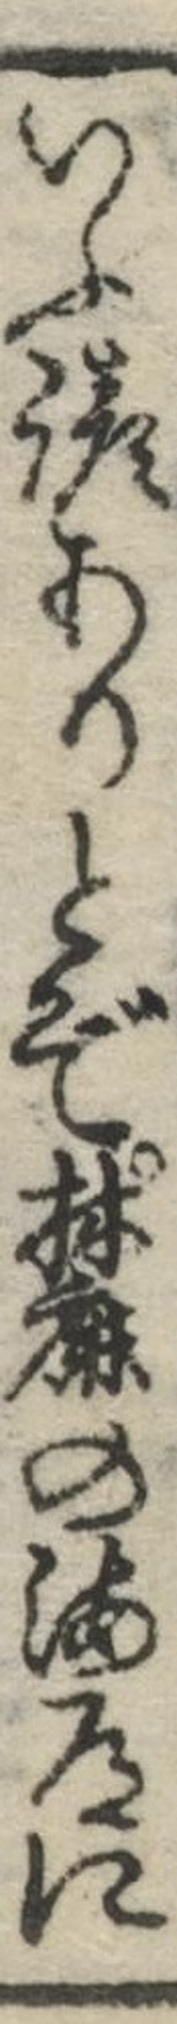いふ諺ありとぞ。麓の海道に
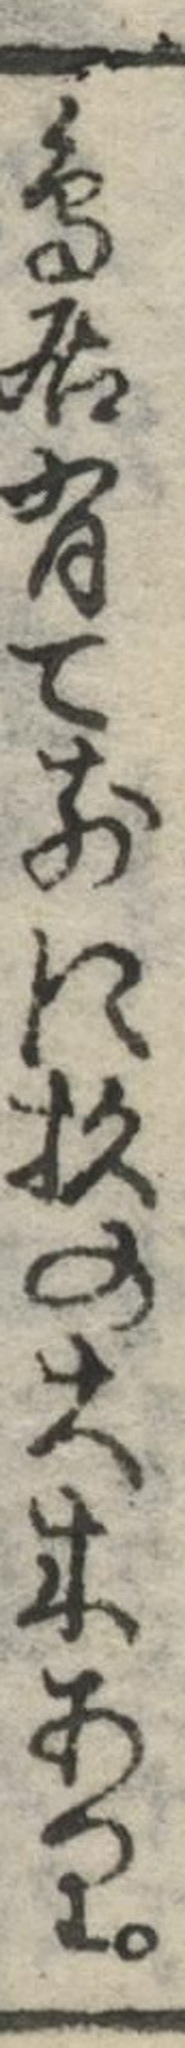鳥居有て前に杉の大木あり。
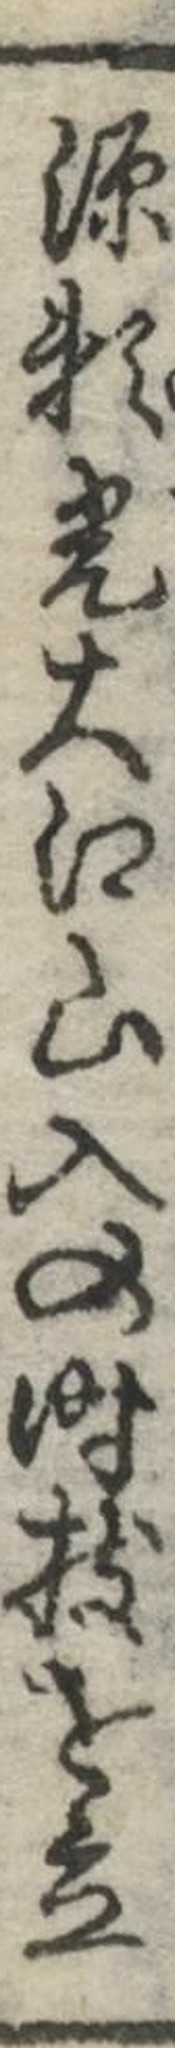源頼光大江山入の時枝を立
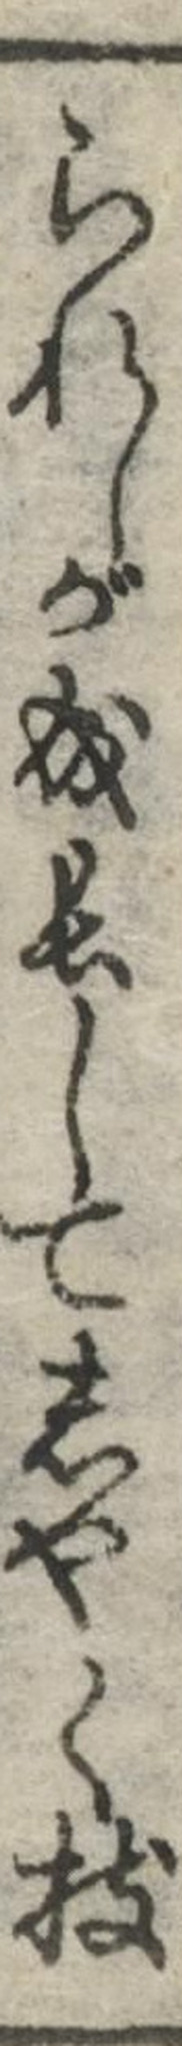られしが成長してはやく枝
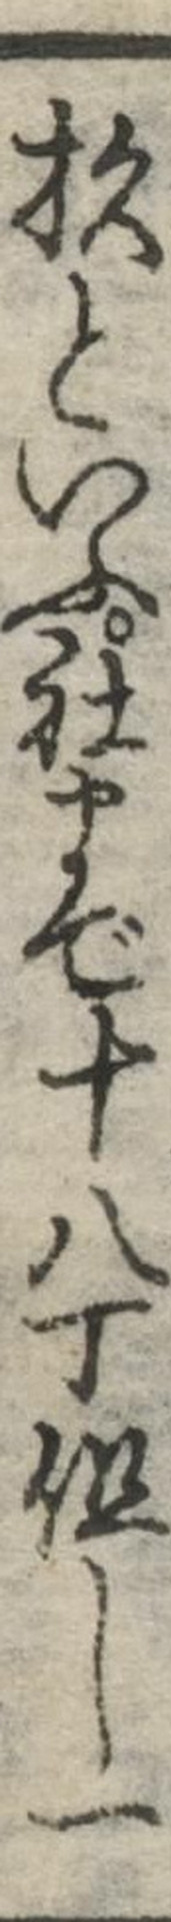杉といふ。社まで十八丁但し一
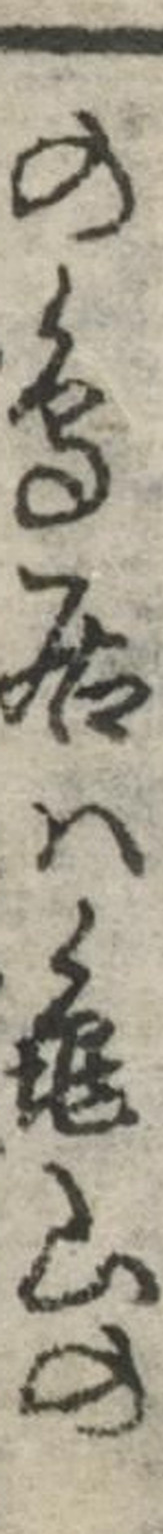の鳥居は亀山の
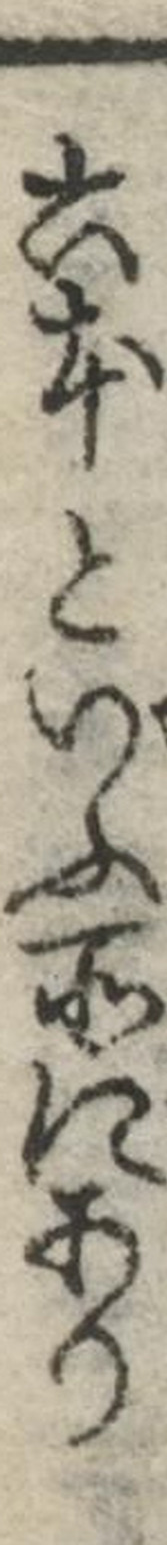六本といふところにあり

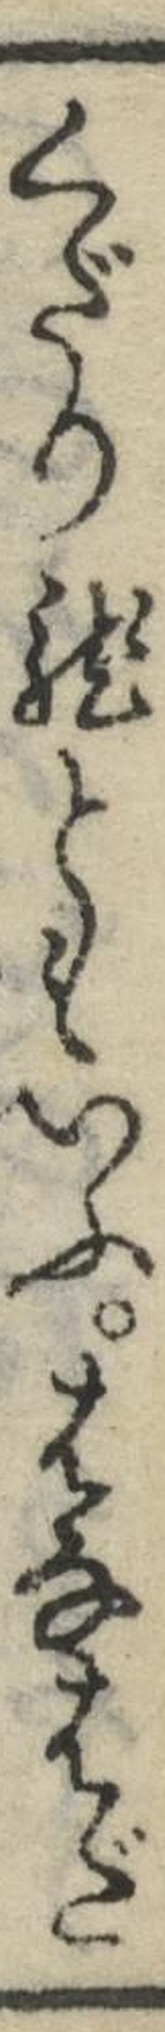くだり龍ともいふ。はなはだ
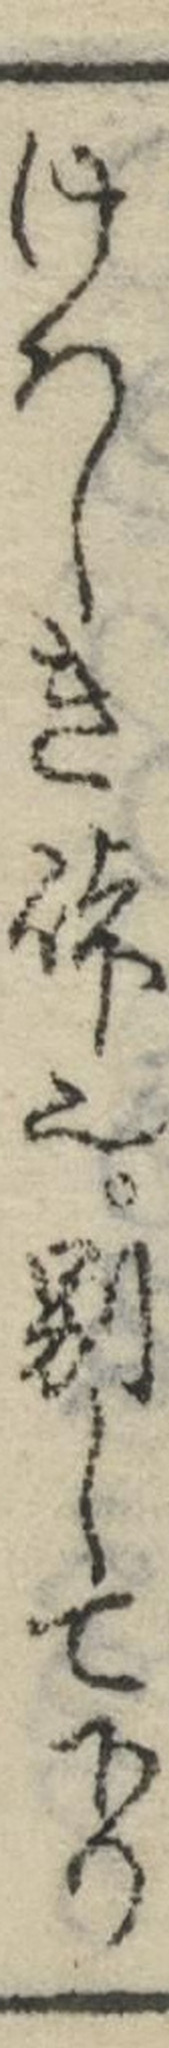けはしき峠也。別して下り
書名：但州城崎浴湯辧
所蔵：東京大学地震研究所図書室 Earthquake Research Institute Library, The University of Tokyo, JAPAN
